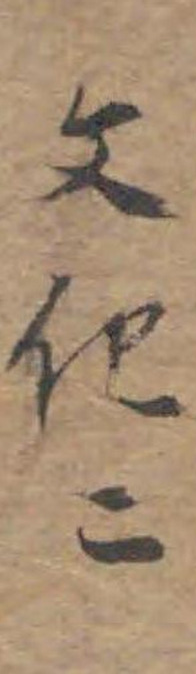文化二

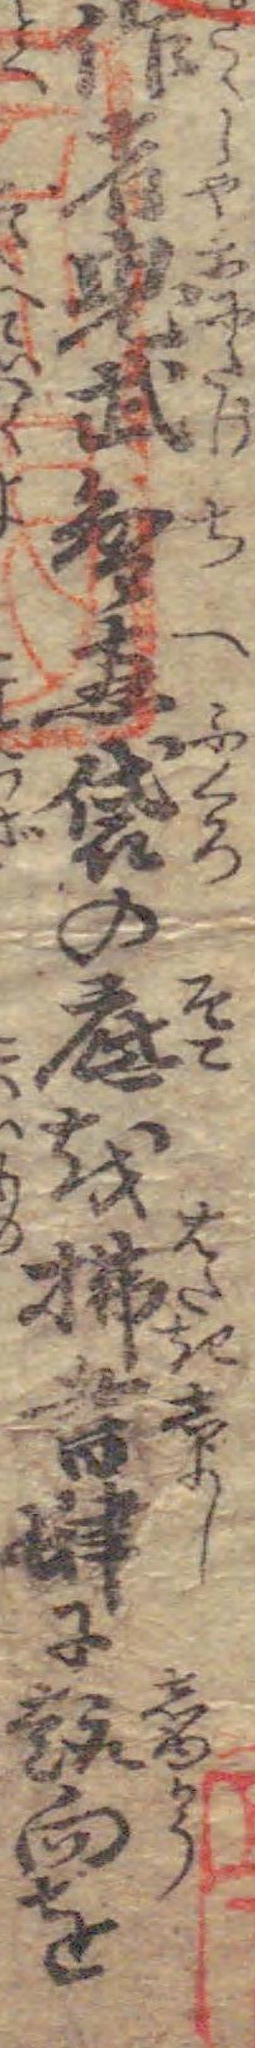作者鬼武智恵袋の底を払書肆に趣向を
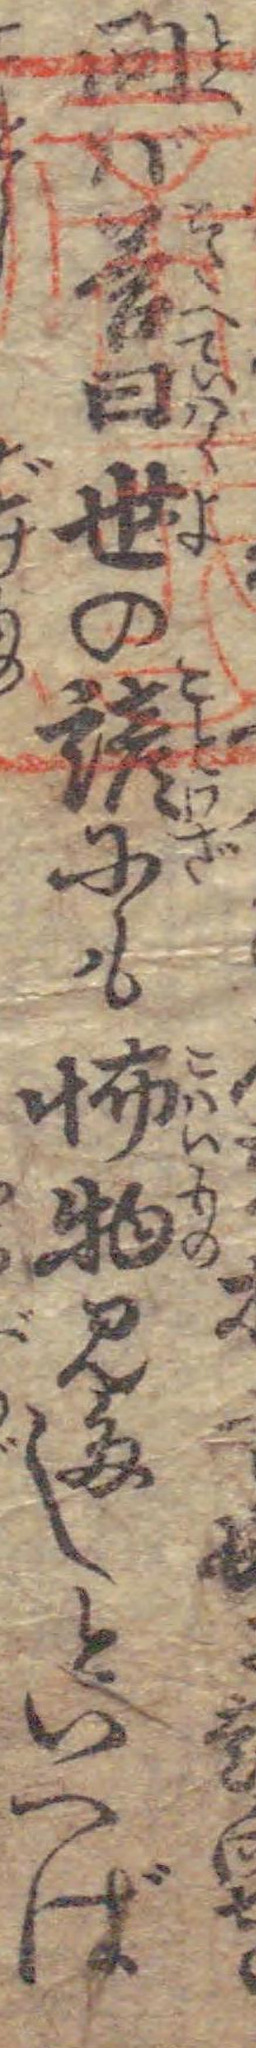問ば答曰世の諺にも怖物見たしといへば
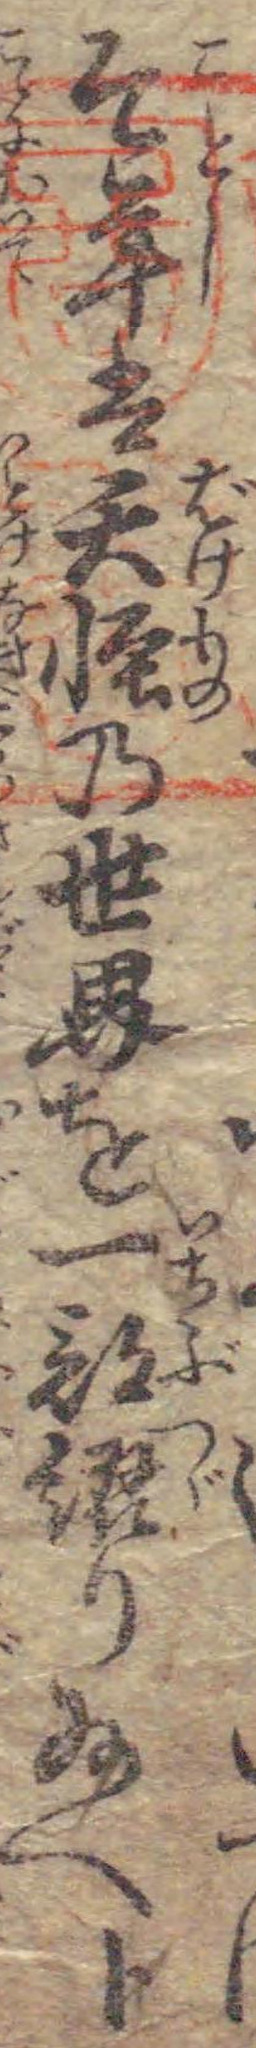今年は夭怪の世界を一部綴り給へと
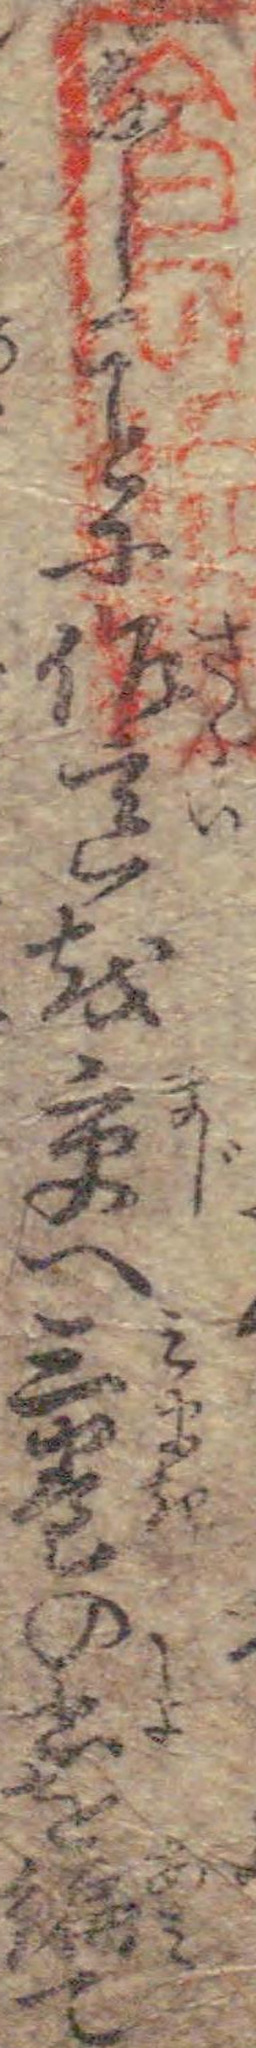根なしことに作意を交へ三巻の書を編て
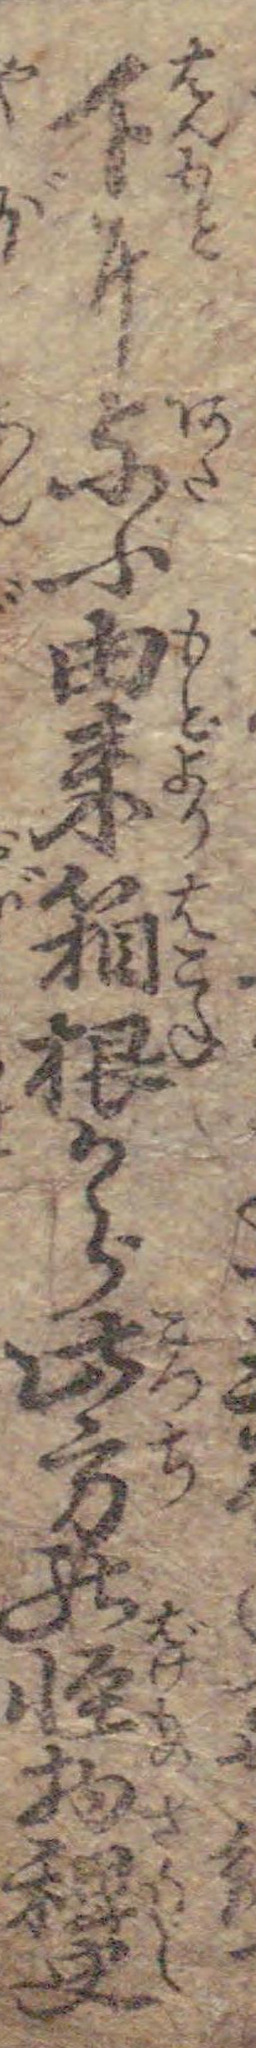下に与ふ由来箱根から此方の怪物稗史
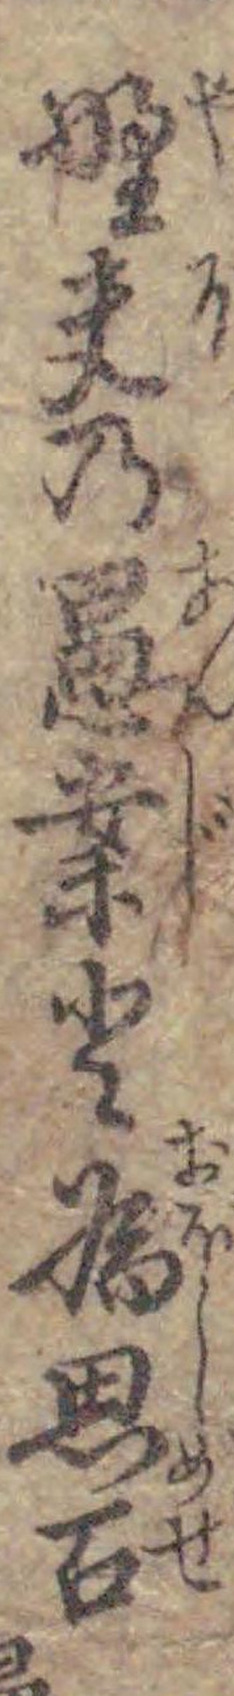野夫の愚案と為思召
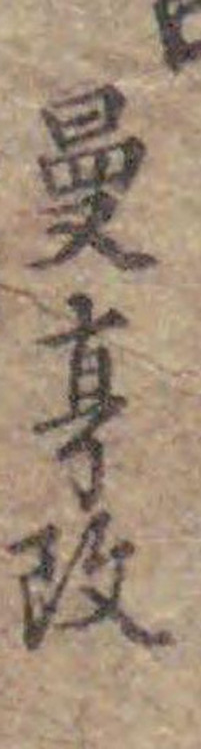曼亭改
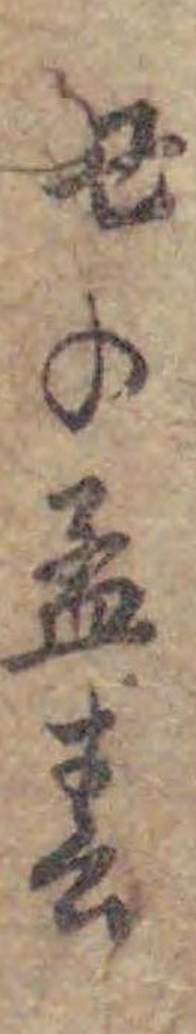丑の孟春
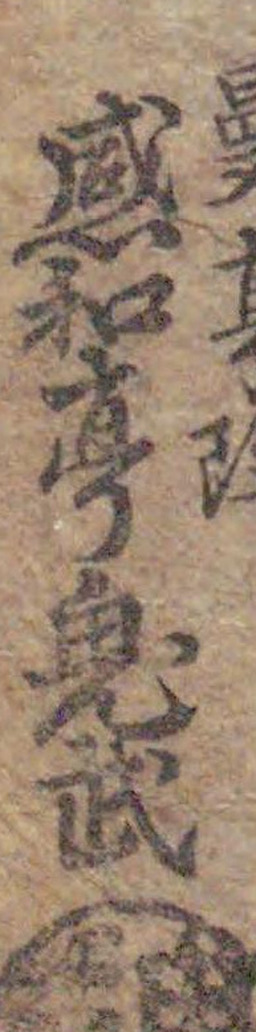感和亭鬼武

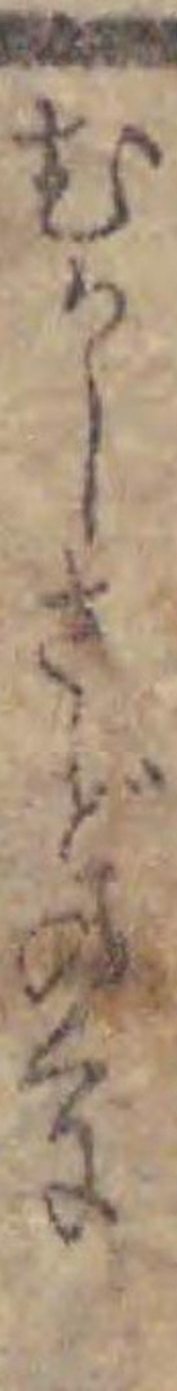むかしさどのくに
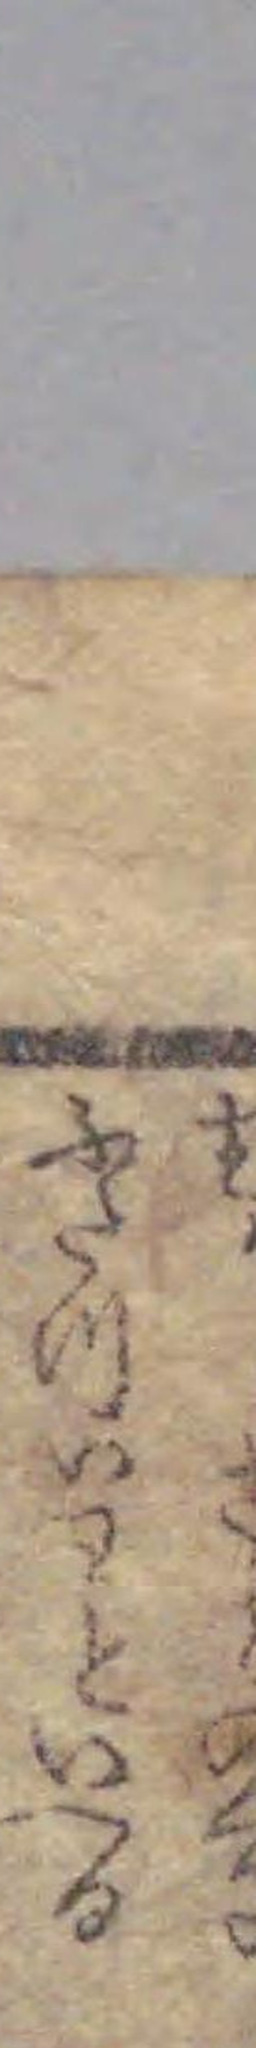ふたついわといへる
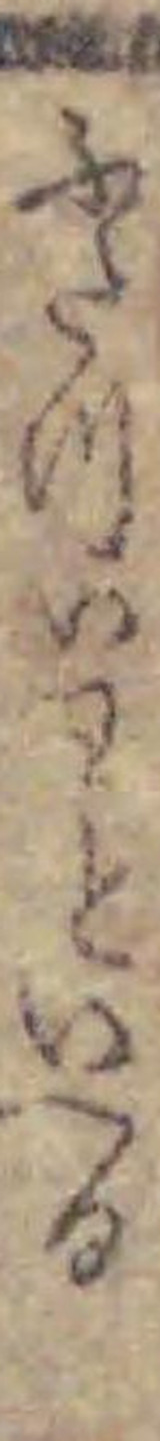ふたついわといへる
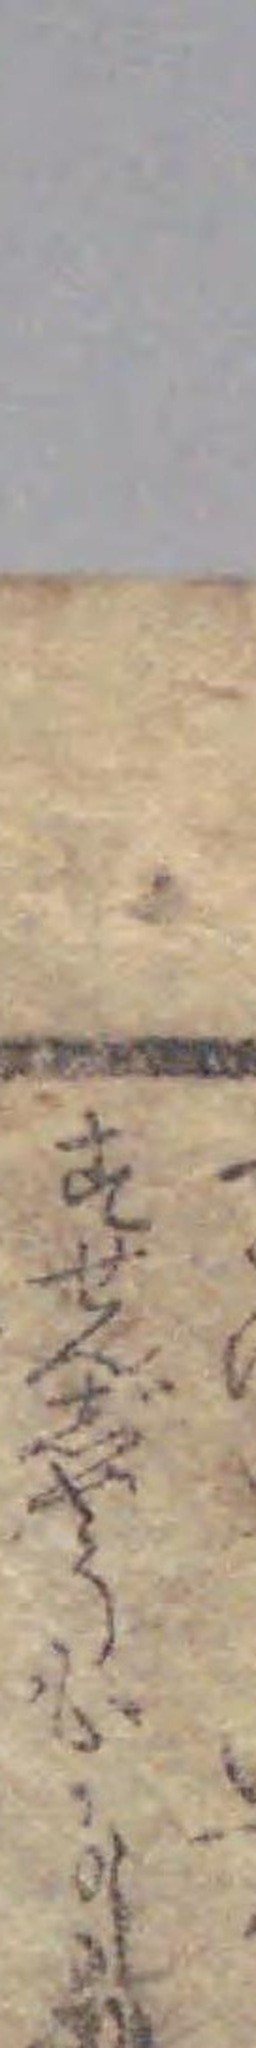すせんじやうも
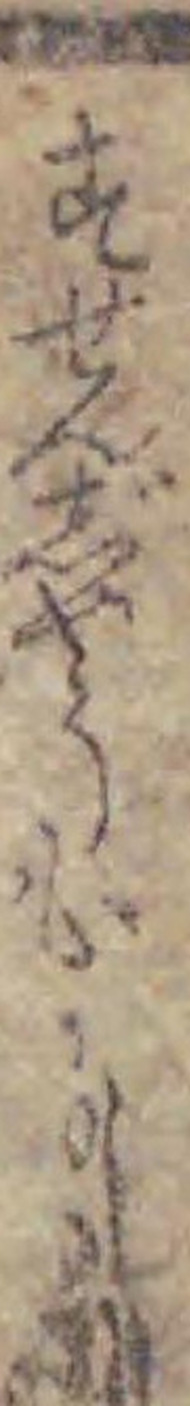すせんじやうも
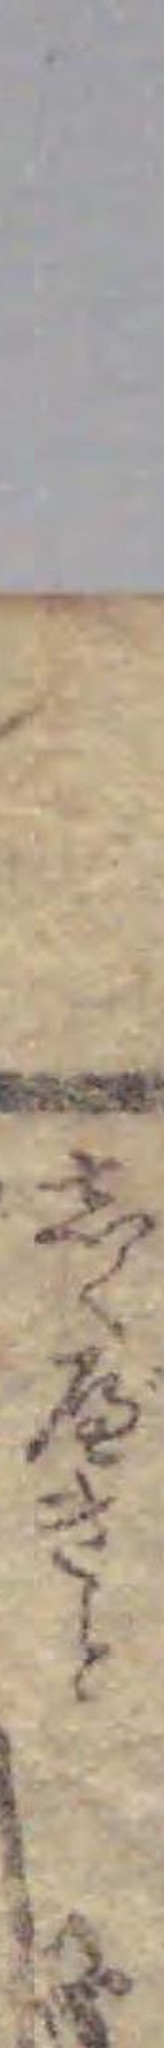しくべきと
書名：化物世界夜半嵐 : 3巻
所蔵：国立国会図書館 National Diet Library, JAPAN
